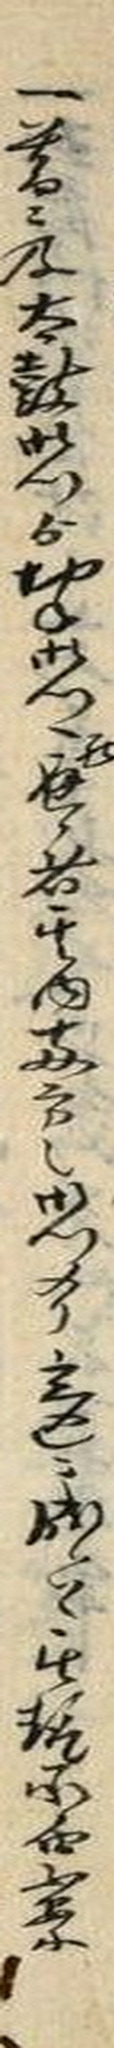一暮ニ及太鼓御門ゟ切手御門へ罷通候者其内両方之御門〆り立込ニ成候ハヽ其趣承届不案
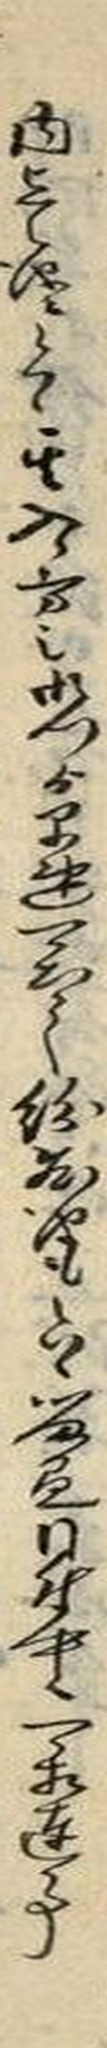内迄之儀ニ候ハヽ其入り方之御門ゟ早速可出之紛敷儀も候ハヽ留置目付中へ可相達事
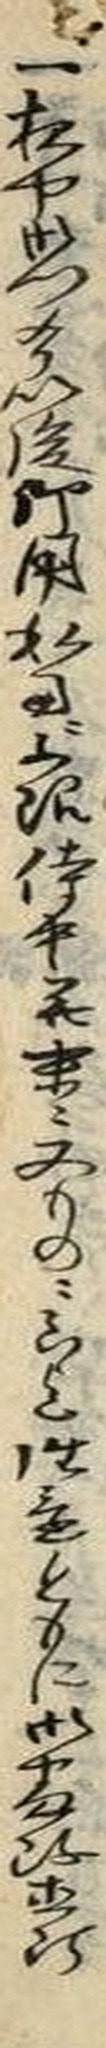一夜中御門〆り以後御用私用ニ不限侍中并末々又ものニ至迄往還ともに御番改直断
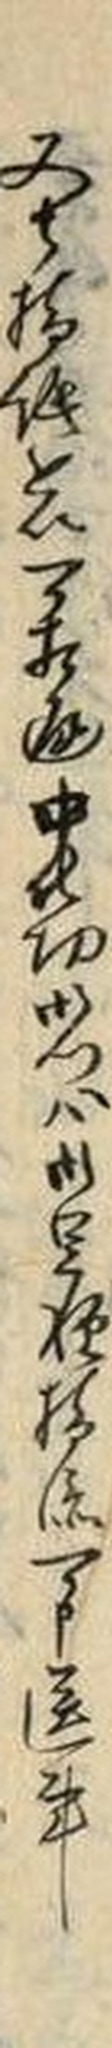又者指紙を以可相通中仕切御門へハ御足軽指添可申達事
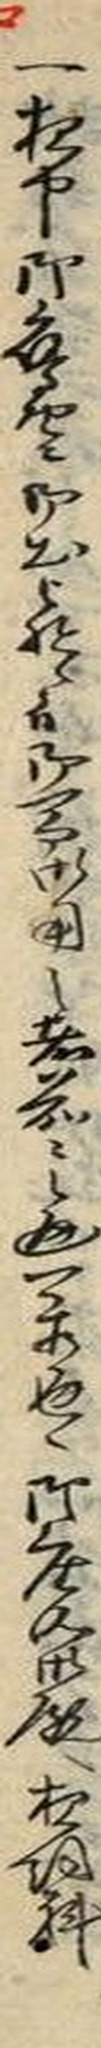一夜中御鷹野ニ御出被遊候ニ付御馬御用之者前々之通可相通候御座所御厩へ夜飼料

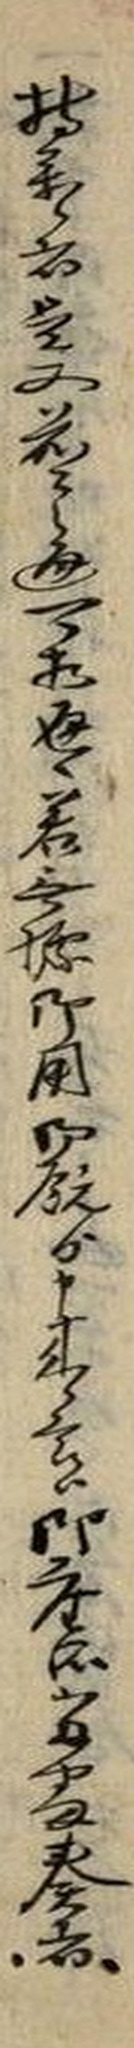持参候者是又前々之通可相通候若無拠御用御厩ゟ申来候節ハ御座所当番奏者
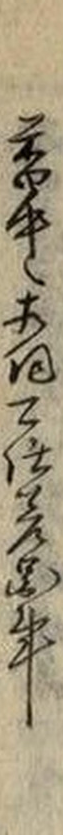番中へ相伺可任差図事
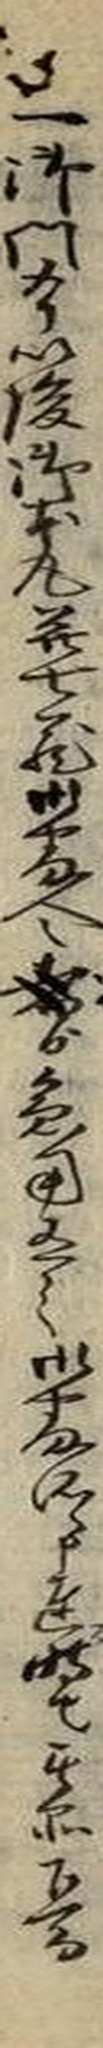一御門〆り以後御本丸并七蔵御番人之宿ゟ急用有之御番所へ申達候時者其品下馬
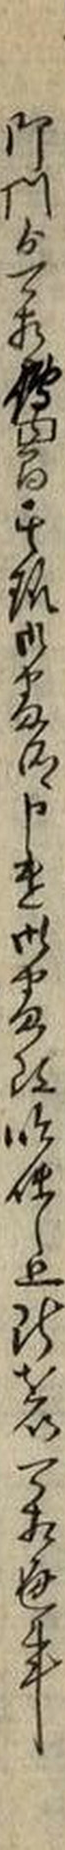御門ゟ可相伝間其趣御番所へ申遣御番改吟味之上断を以可相通事
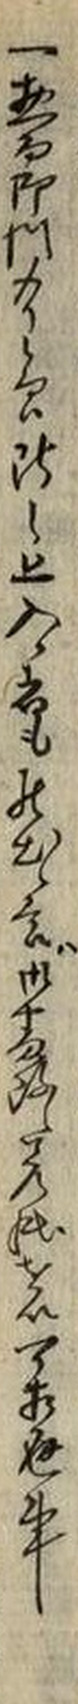一惣而御門〆り候而ハ断之上入候者も罷出候節ハ御番改へ差紙を以可相通事
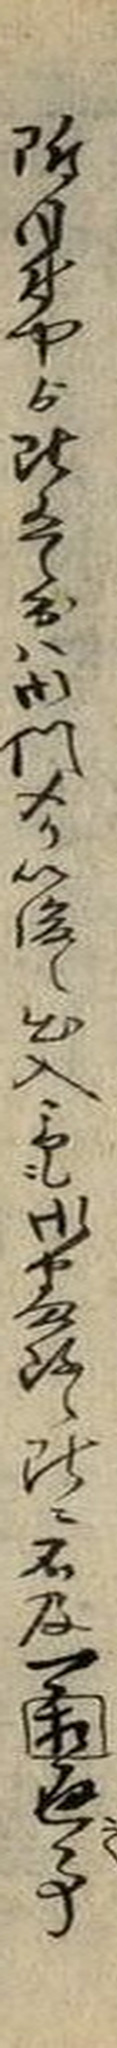附目付中ゟ断有之候分ハ御門〆り以後之出入ニ而も御番改之断ニ不及可通之事
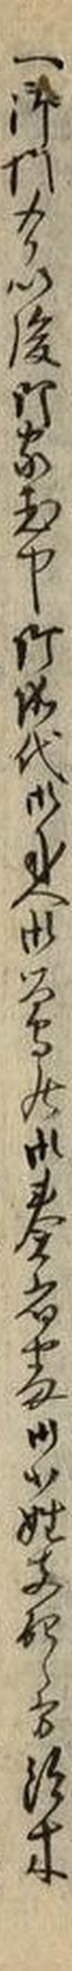一御門〆り以後御家老中御城代御用人御留守居御奏者番御小姓支配之方鈴木
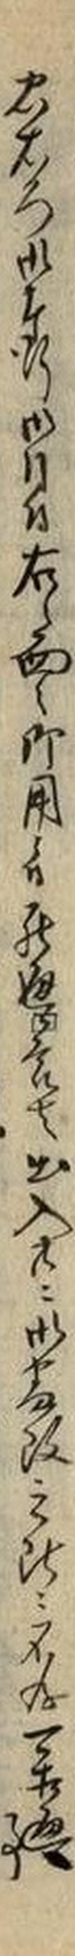忠左衛門御奉行御目付右之面々御用ニ付罷通節者出入共ニ御番改之断ニ不及可相通事
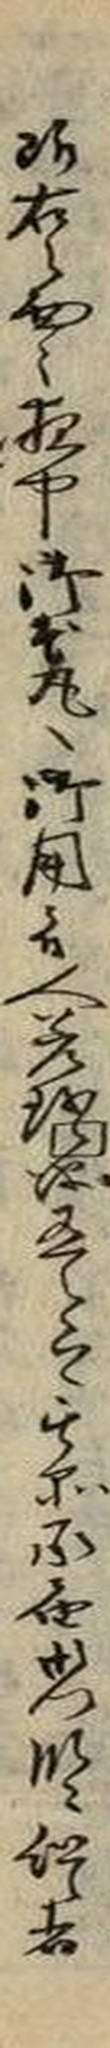附右之面々夜中御本丸へ御用ニ付人差越儀有之候ハヽ其品承届御門段々組之者
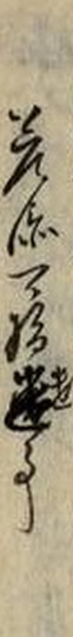差添可指遣事
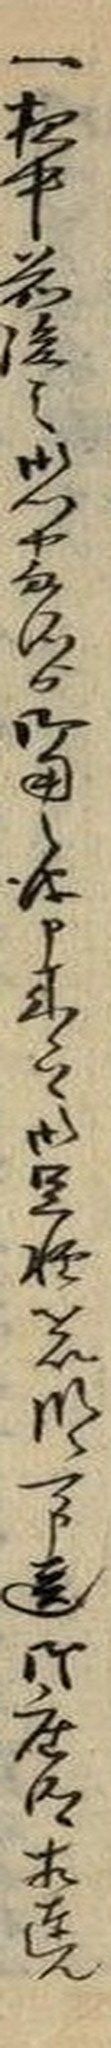一夜中前後之御門番所ゟ御用之儀申来候ハヽ御足軽を以段々可申達御座所へ相達候
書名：御門御櫓之部
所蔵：福井県文書館 Fukui Prefectural Archives
